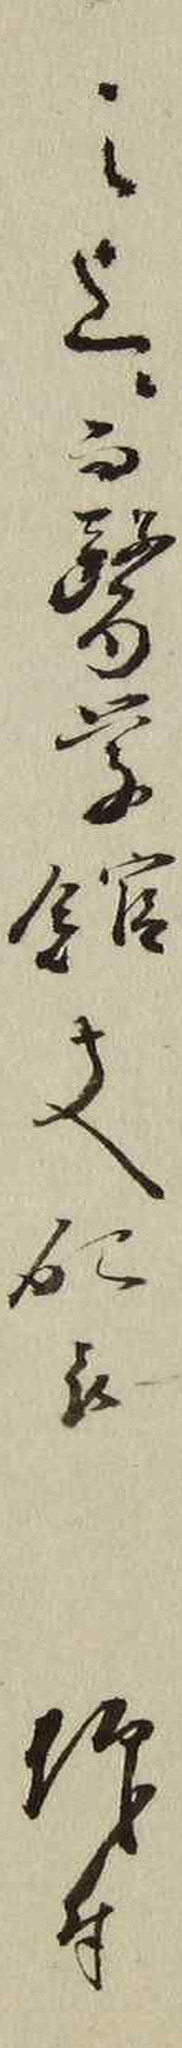之上ニ而医学館支配被仰付
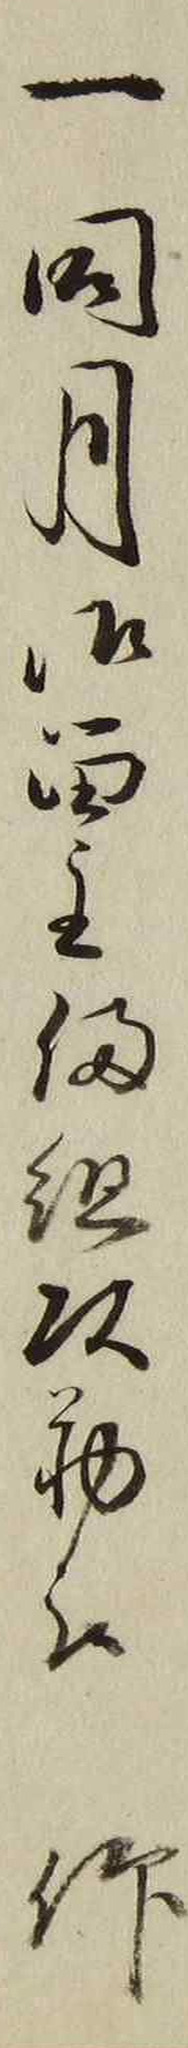一同月御留主備組頭勤被仰
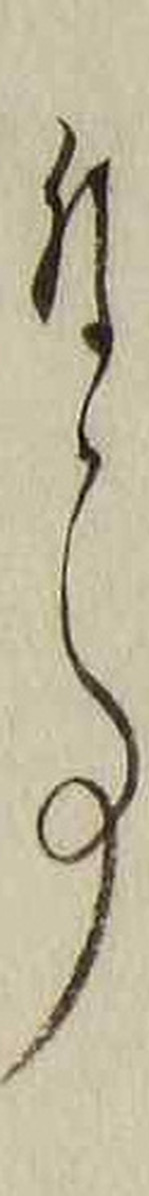付候事
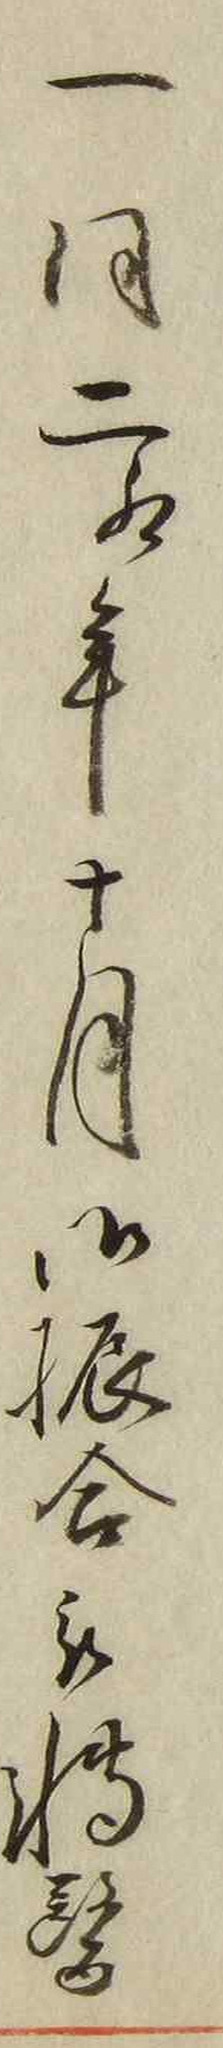一同二卯年十月御振合被転医

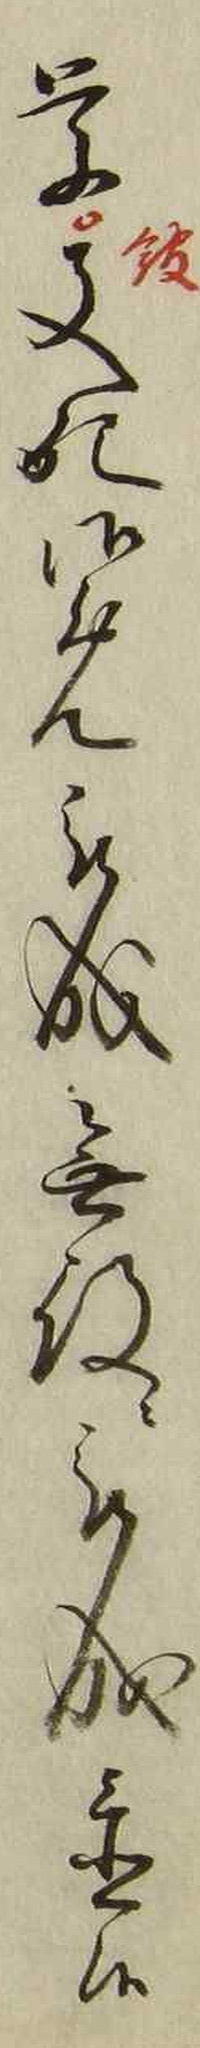学◦館支配御免被成無役ニ被成置候
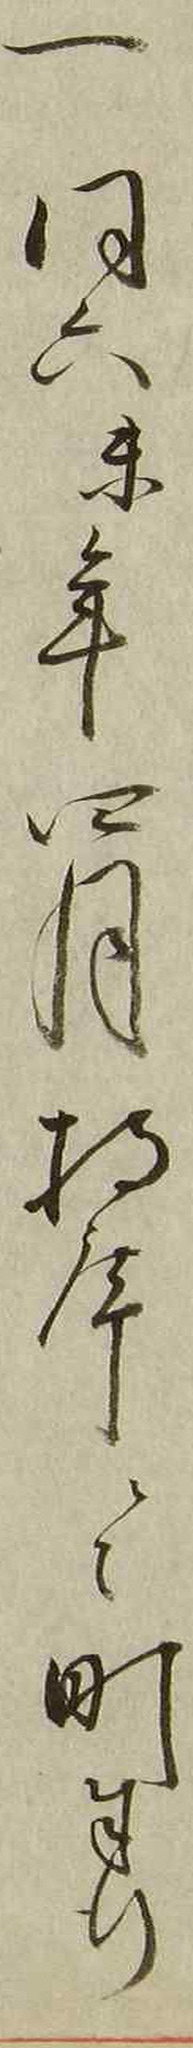一同六未年四月持席ニて町奉行
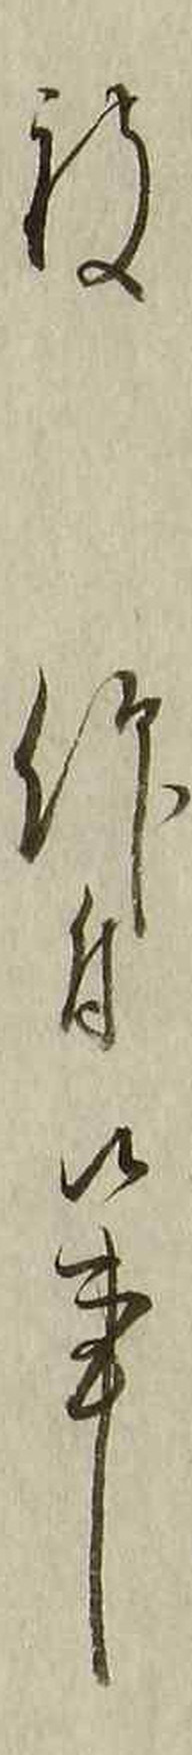被仰付候事
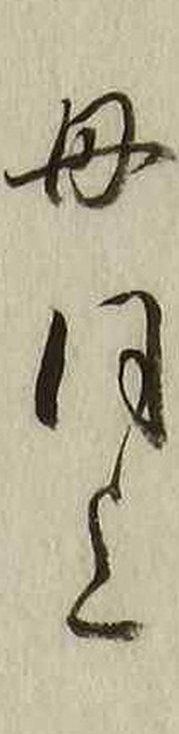母同上
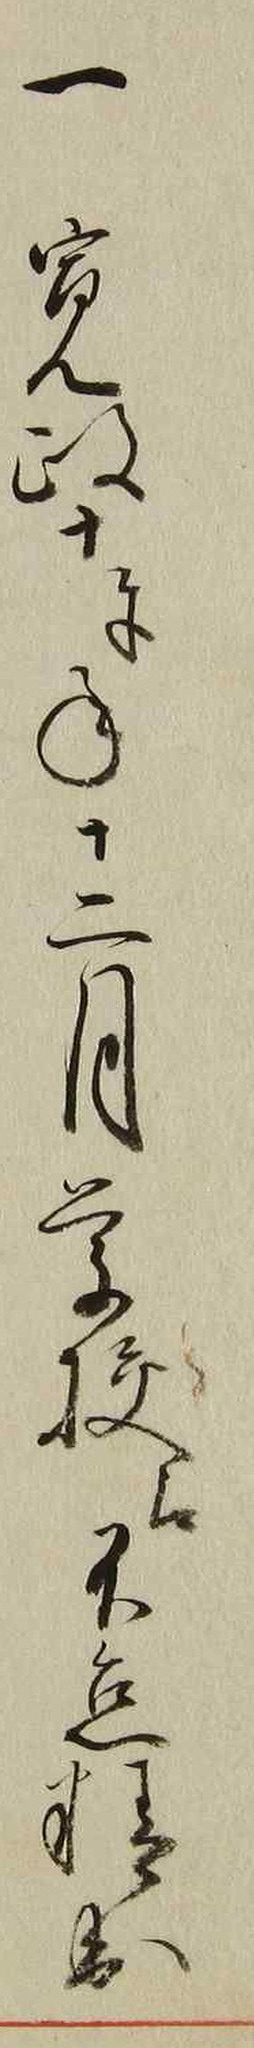一寛政十午年十二月学校江不怠精出
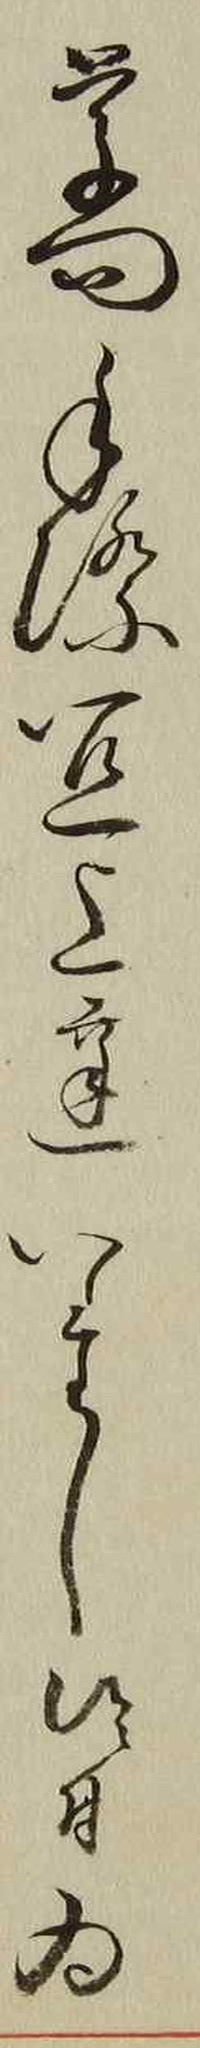学問手際宜上達いたし候ニ付為
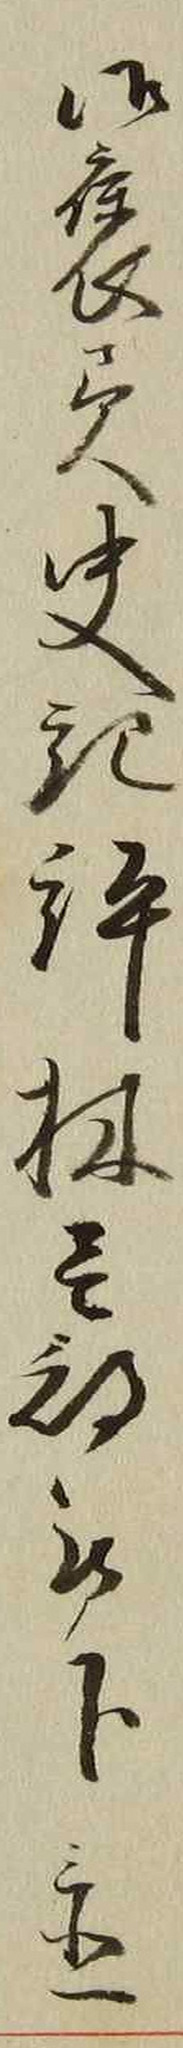御褒美史記評林壱部被下置
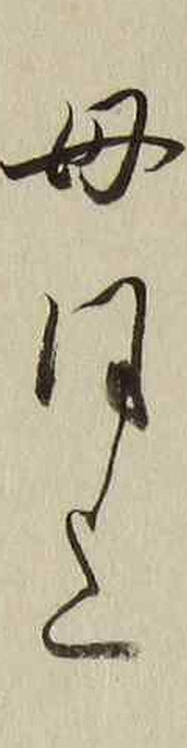母同上

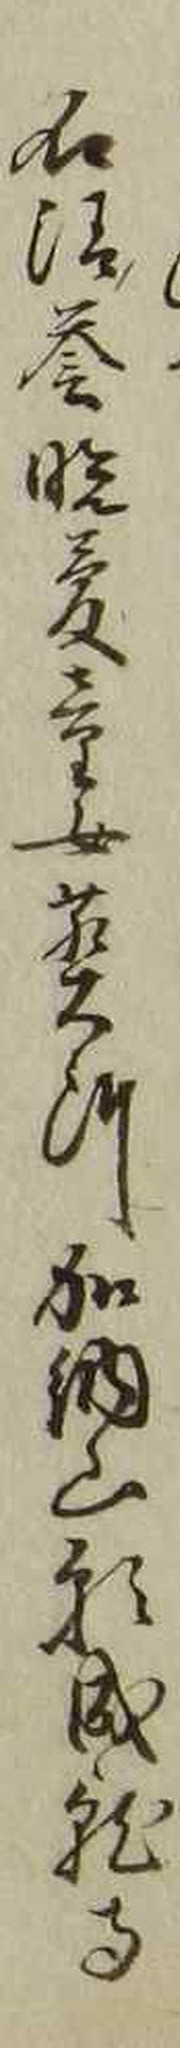名清誉晩夢童女葬所加納山願成就寺
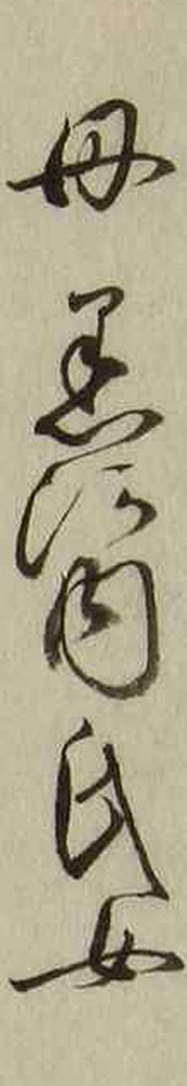母黒河内氏女
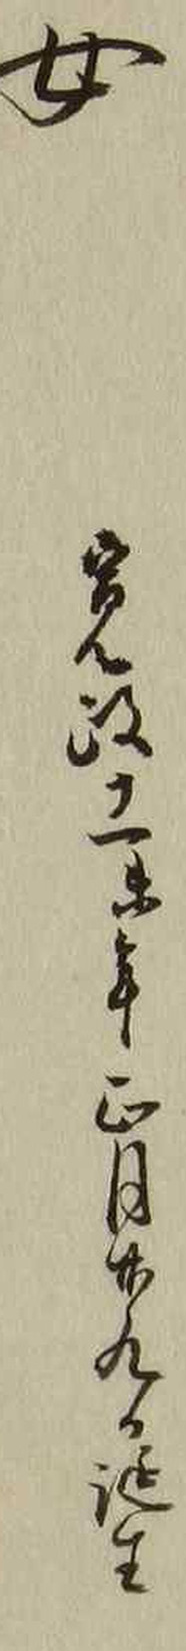女寛政十一未年正月廿九日誕生
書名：諸士系譜　巻之2　い之部2
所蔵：会津若松市立会津図書館
